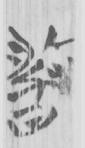敢
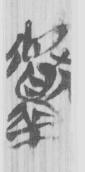獻
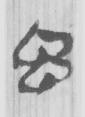玄
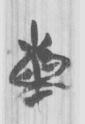柬
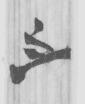之
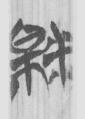{帛㡀}
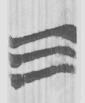三
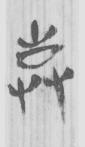束
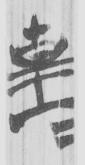皇=
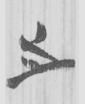之
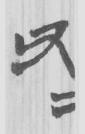父=
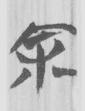余
